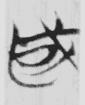或
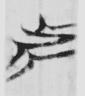延
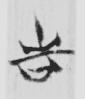告
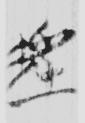𫊟
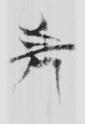先
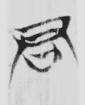君
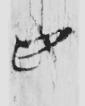女
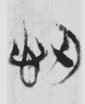忍
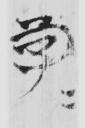乳=
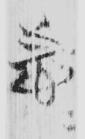志=
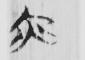亦
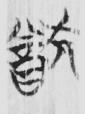猶
